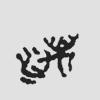澫
